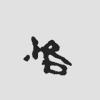降
